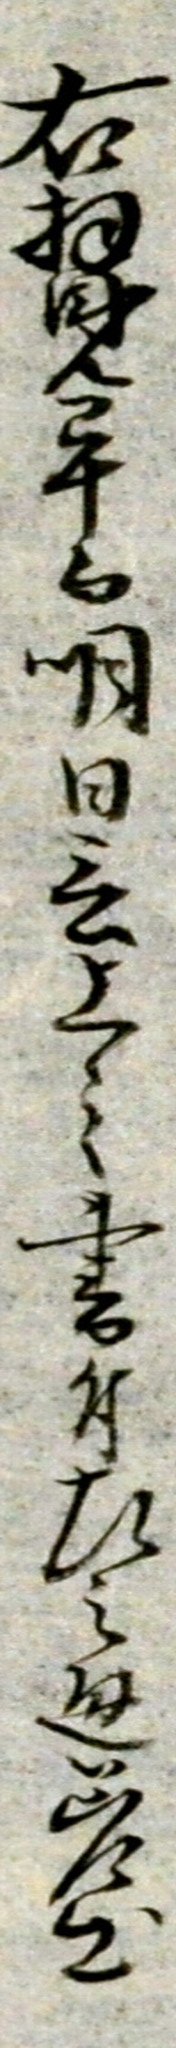右拝見畢而明日言上之書付左之通差出
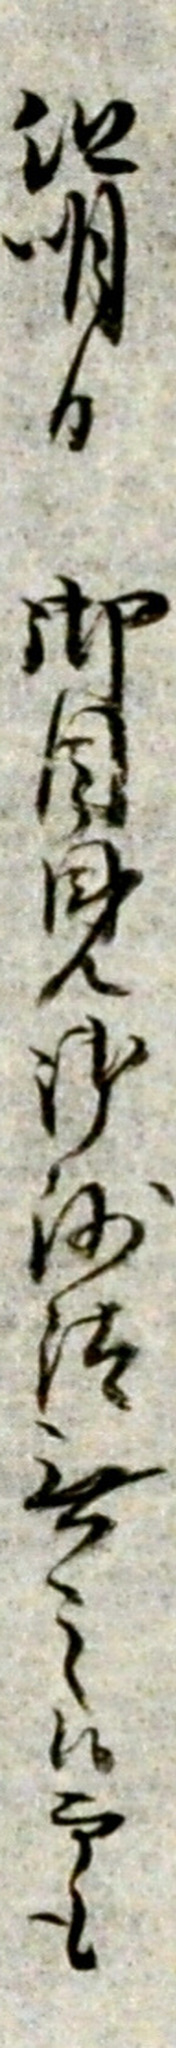但明日御目見御沙汰無之候而も
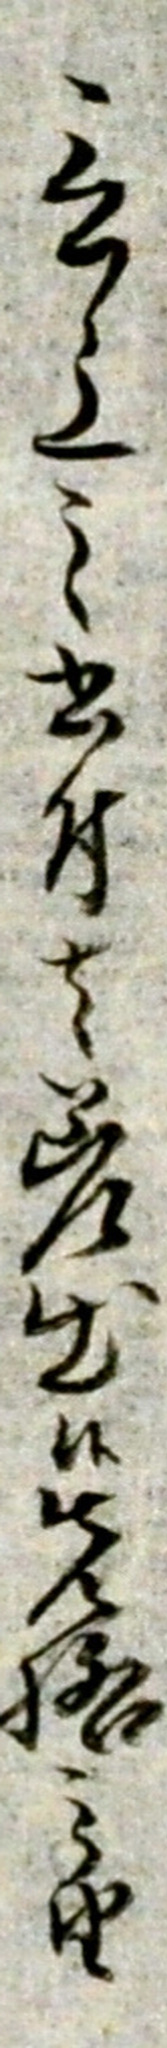言上之書付者差出候先格之由
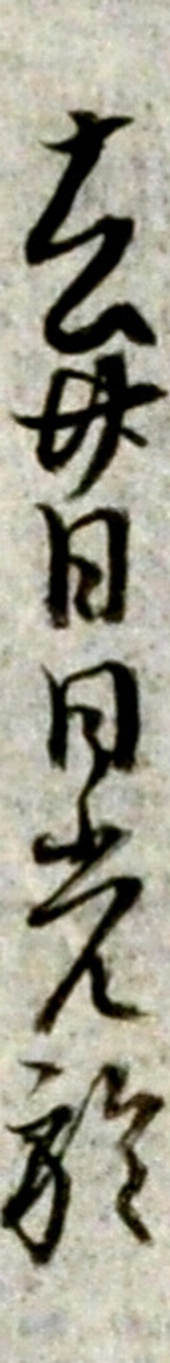去廿日日光於
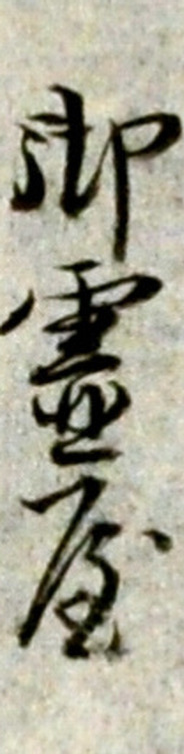御霊屋
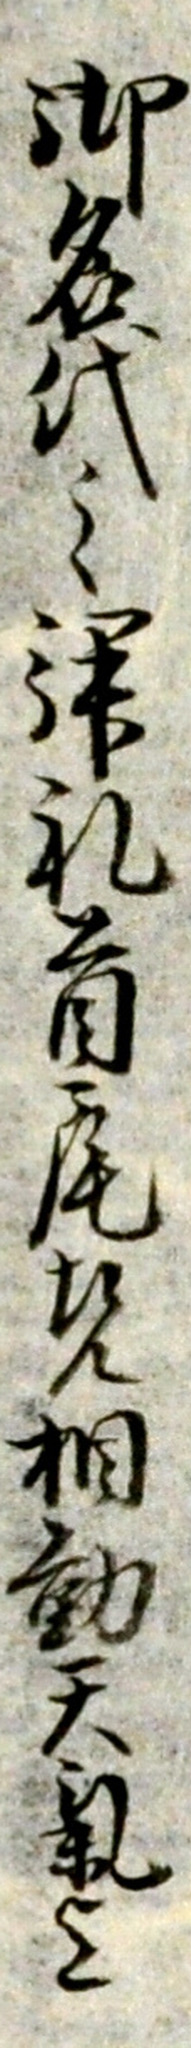御名代之拝礼首尾克相勤天気迄
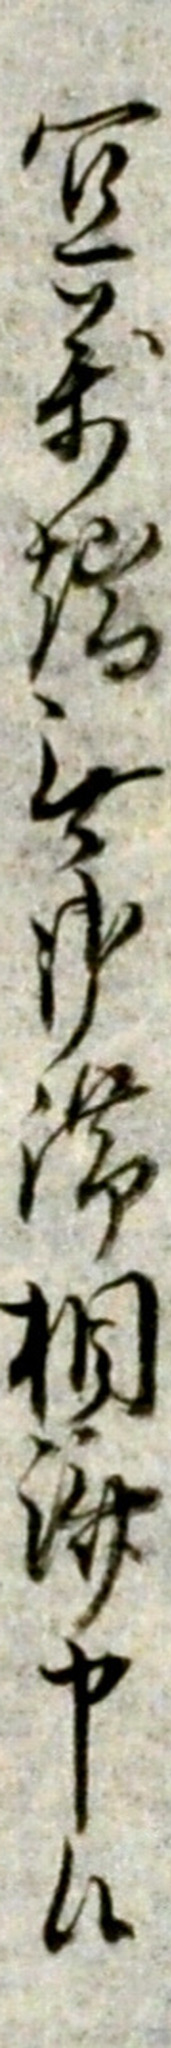宜万端無御滞相済申候
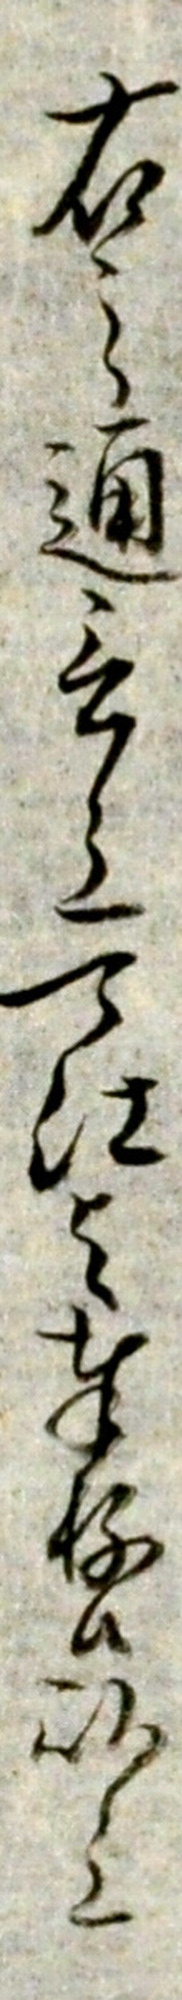右之通言上可仕と奉存候以上
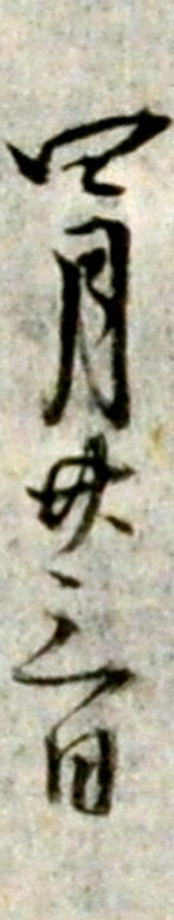四月廿三日
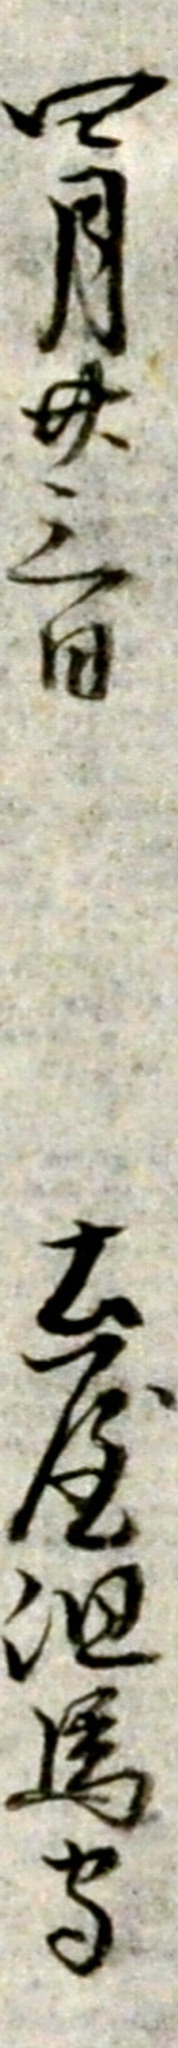四月廿三日土屋但馬守
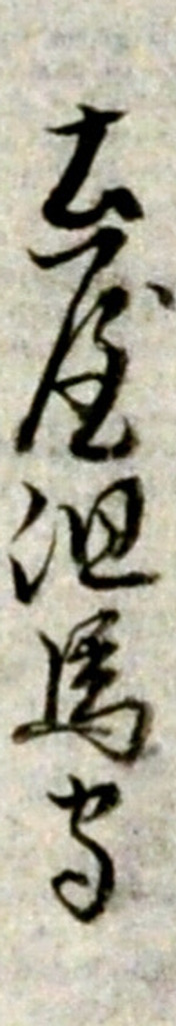土屋但馬守
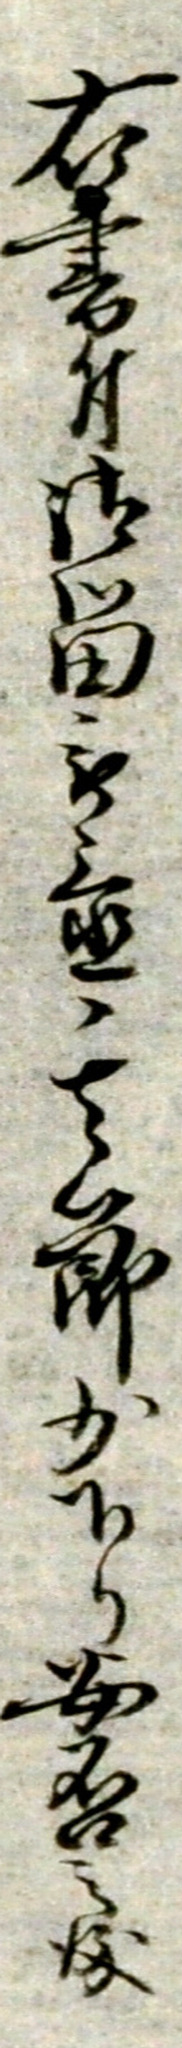右書付御留被置其節少下り安否之儀
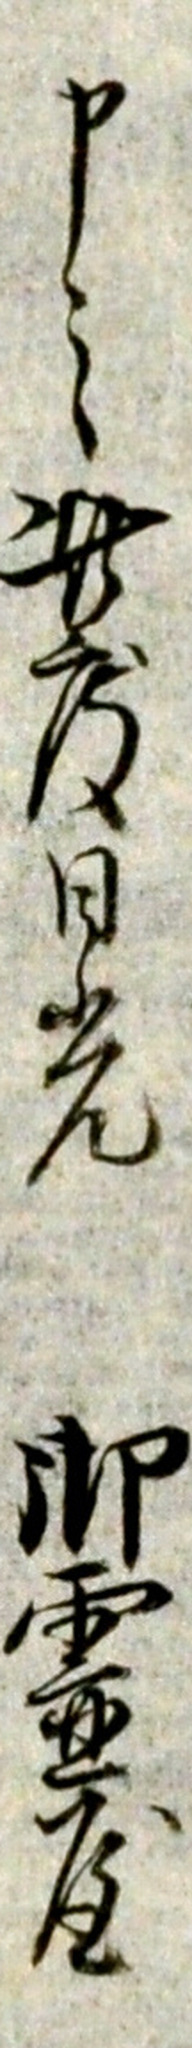申之此度日光御霊屋
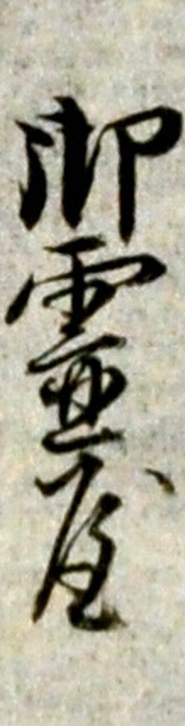御霊屋
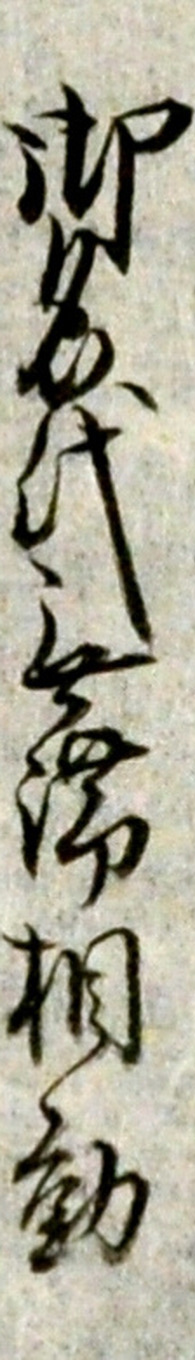御名代無滞相勤
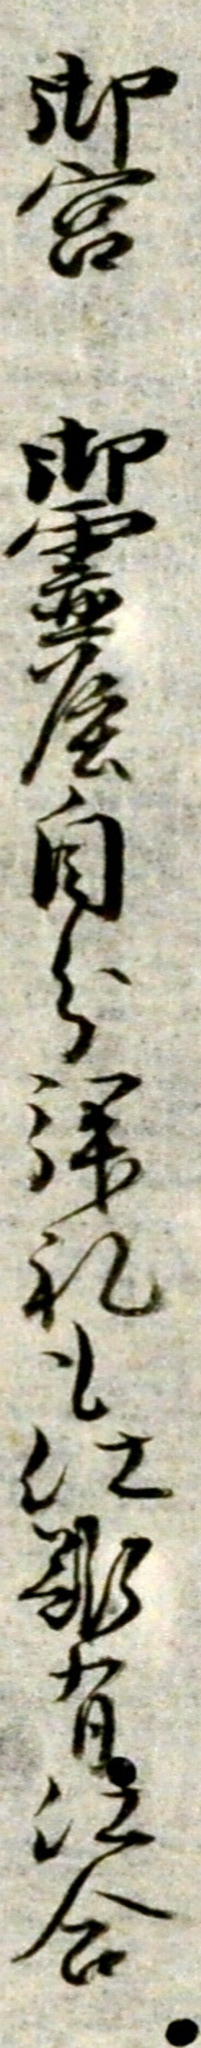御宮御霊屋自分拝礼も仕難有仕合
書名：日光御名代相勤候節ノ留
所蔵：伊那市立高遠町図書館・合同会社AMANE
